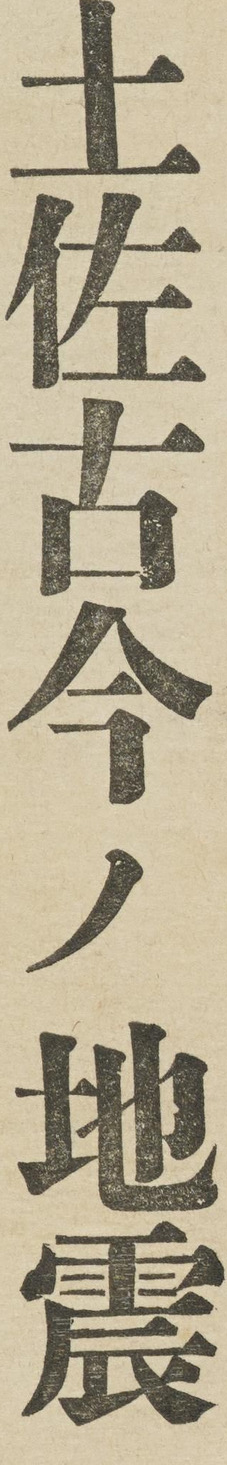土佐古今ノ地震
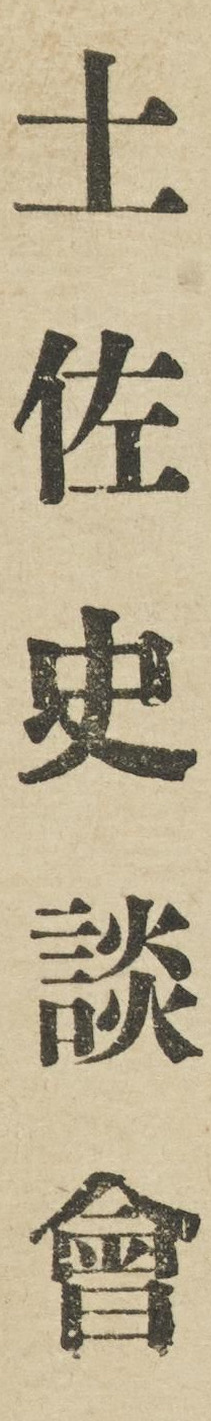土佐史談会

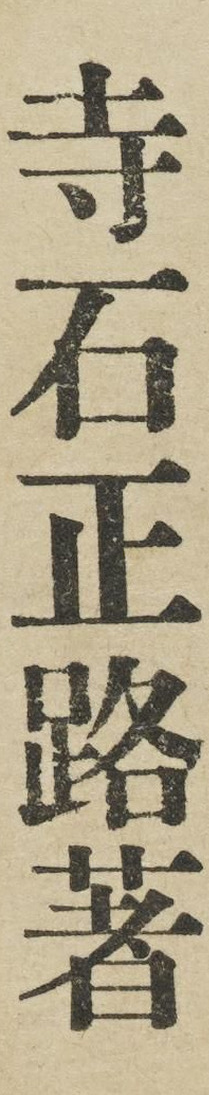寺石正路著
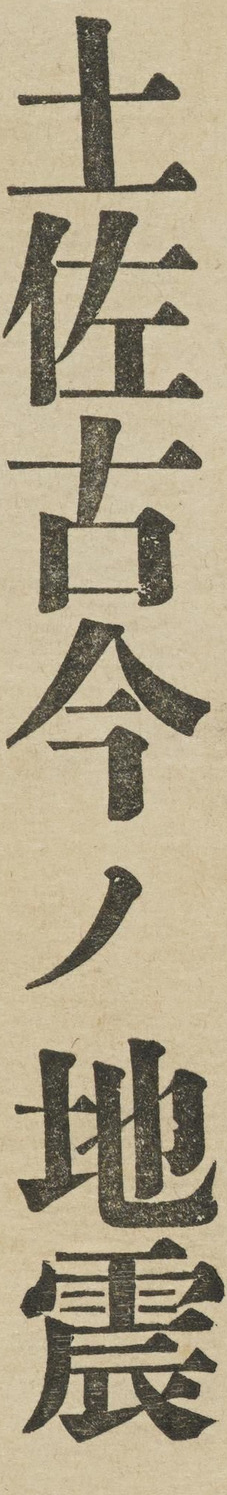土佐古今ノ地震
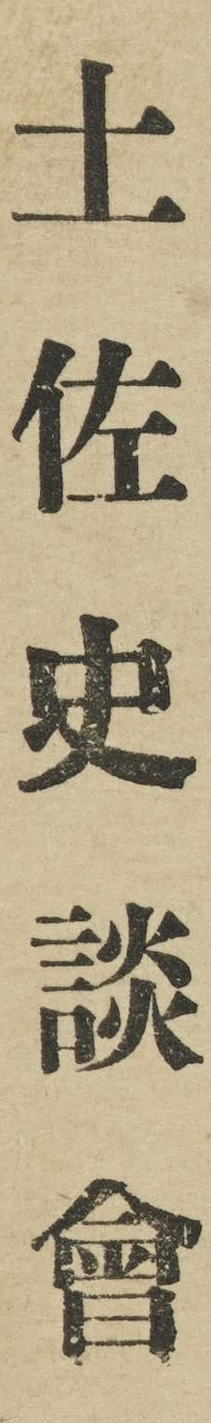土佐史談会

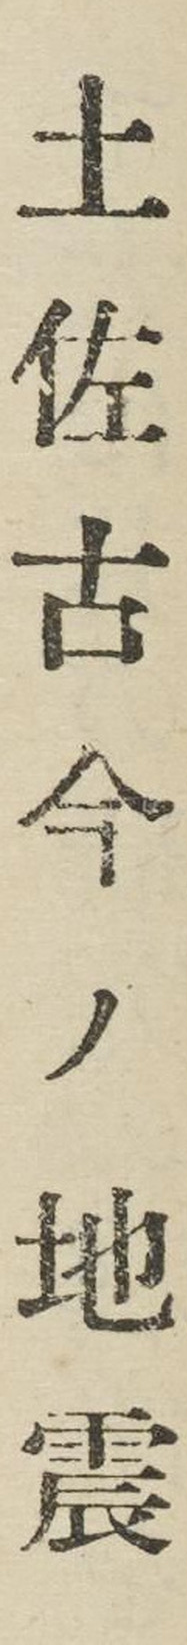土佐古今ノ地震
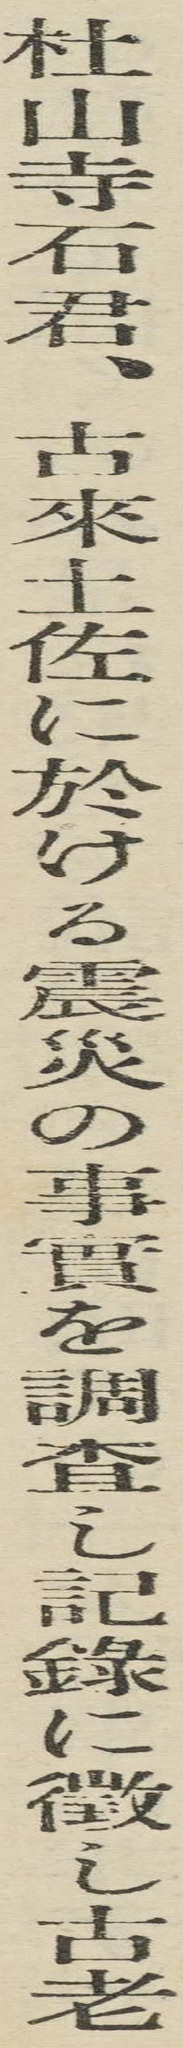杜山寺石君、古来土佐に於ける震災の事実を調査し記録に徴し古老
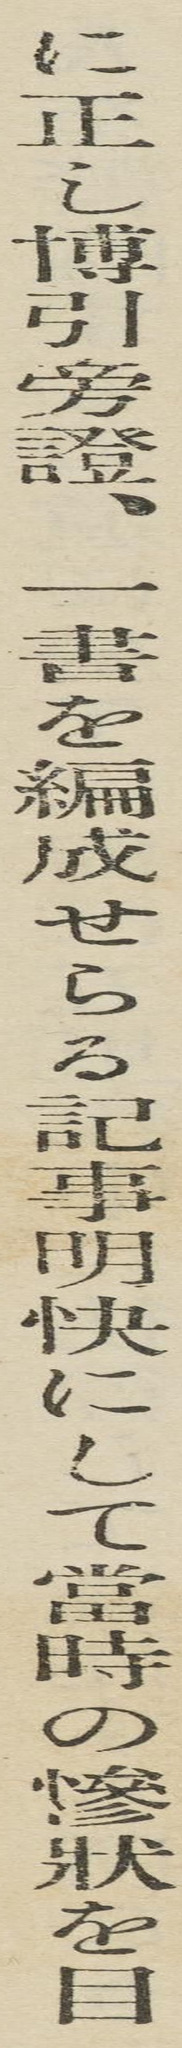に正し博引旁証、一書を編成せらる記事明快にして当時の惨状を目
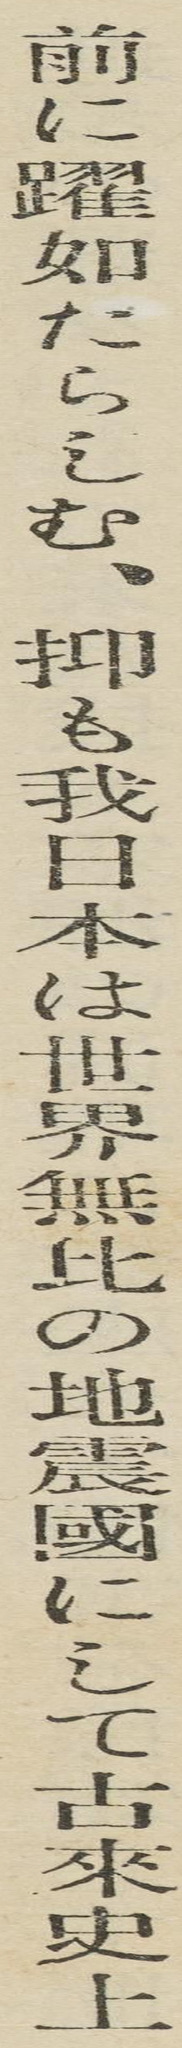前に躍如たらしむ、抑も我日本は世界無比の地震国にして古来史上
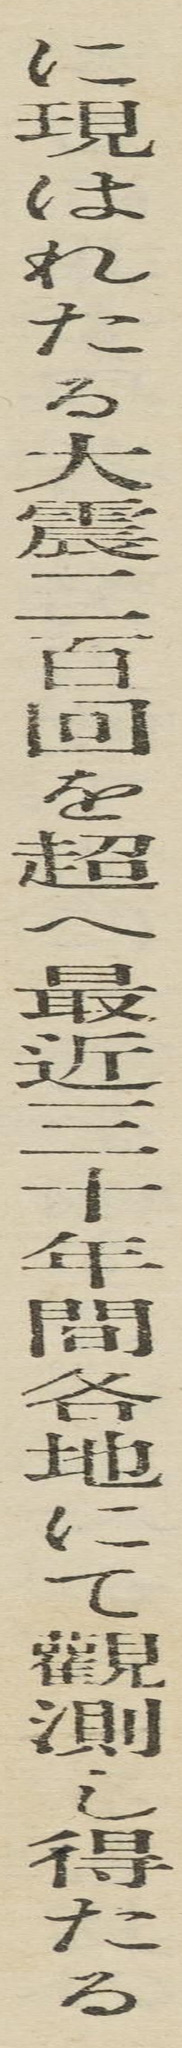に現はれたる大震二百回を超へ最近三十年間各地にて観測し得たる
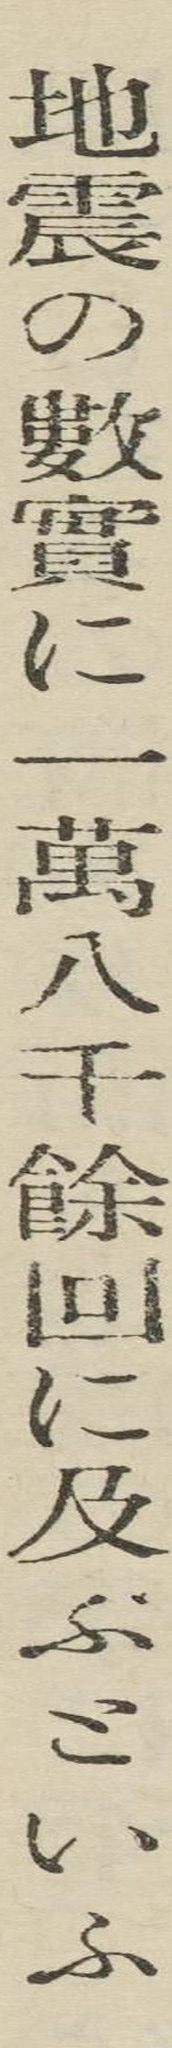地震の数実に一万八千余回に及ぶといふ
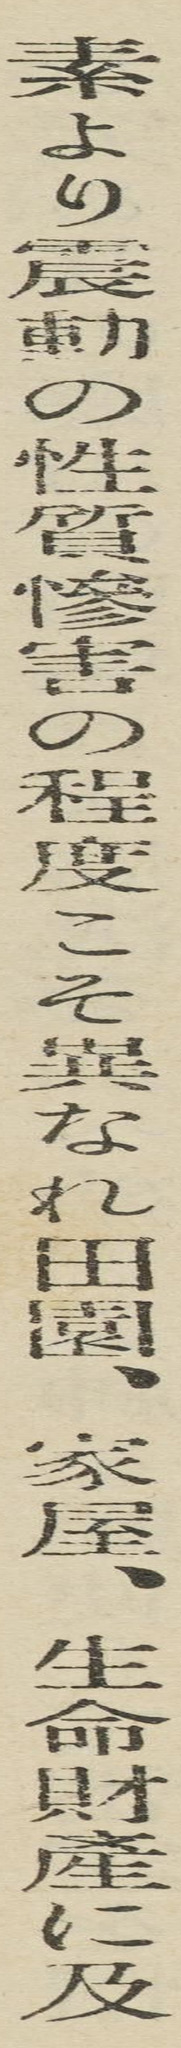素より震動の性質惨害の程度こそ異なれ田園、家屋、生命財産に及
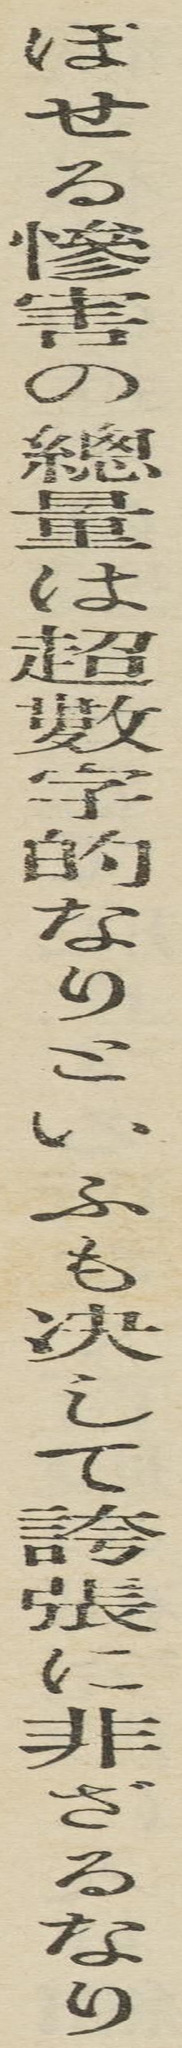ほせる惨害の総量は超数字的なりといふも決して誇張に非ざるなり
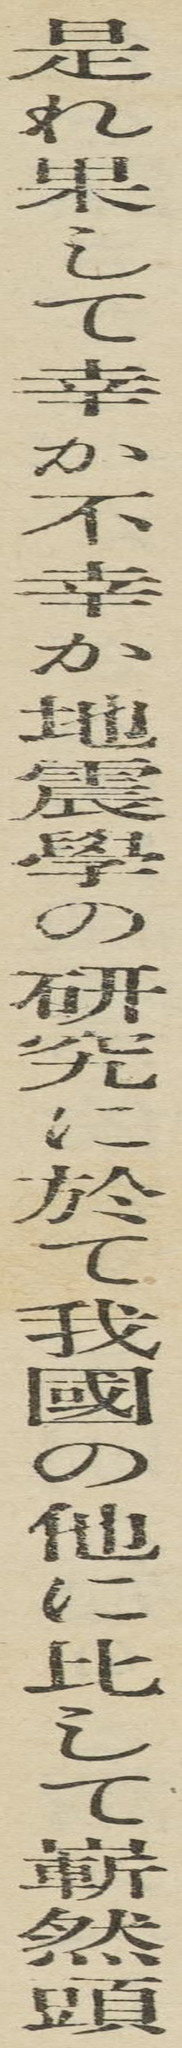是れ果して幸か不幸か地震学の研究に於て我国の他に比して嶄然頭

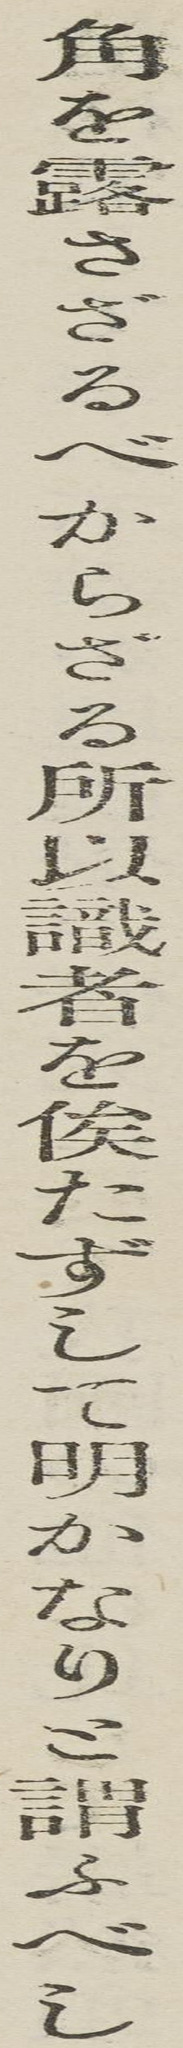角を露さざるべからざる所以識者を俟たずして明かなりと謂ふべし
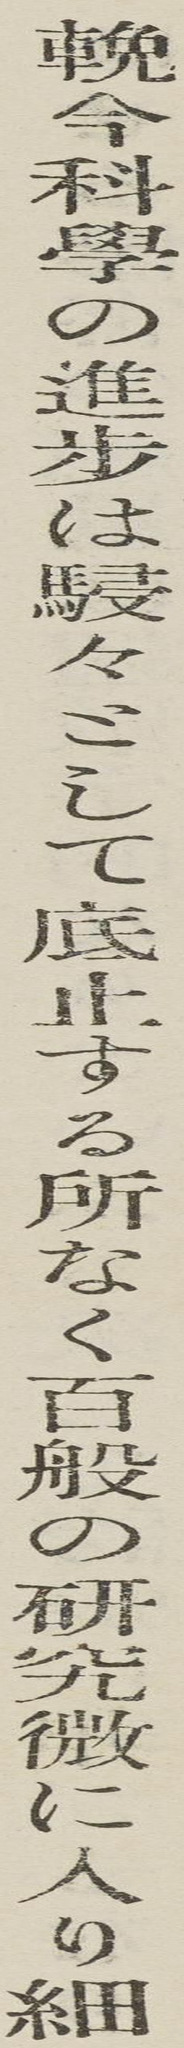輓今科学の進歩は駸々として底止する所なく百般の研究微に入り細
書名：土佐古今ノ地震
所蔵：東京大学地震研究所図書室 Earthquake Research Institute Library, The University of Tokyo, JAPAN
